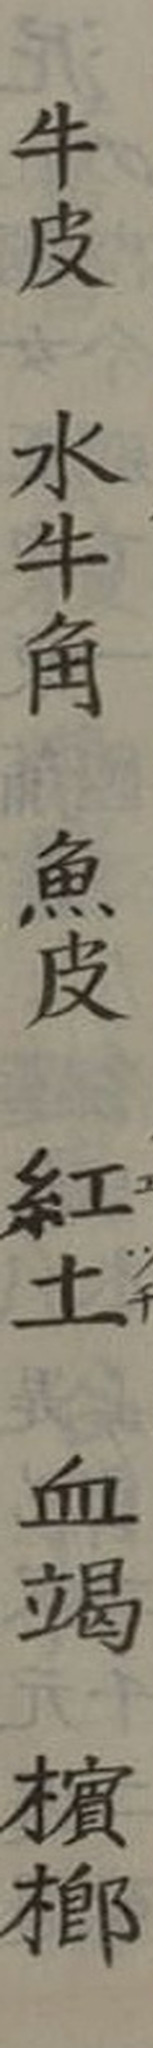牛皮水牛角魚皮紅土血竭㯽榔
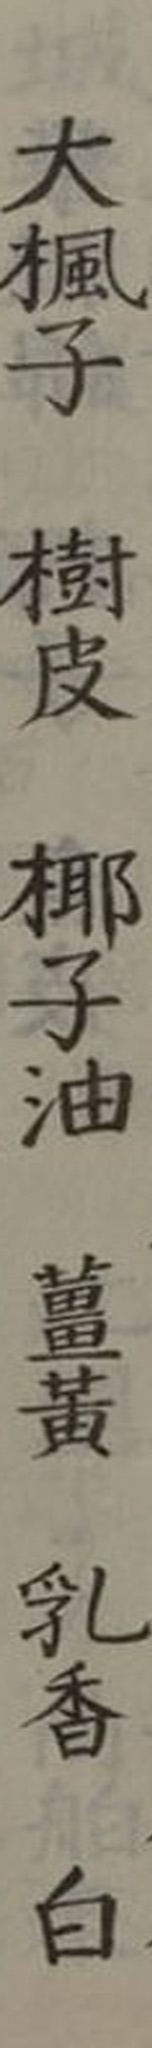大楓子樹皮椰子油薑黃乳香白
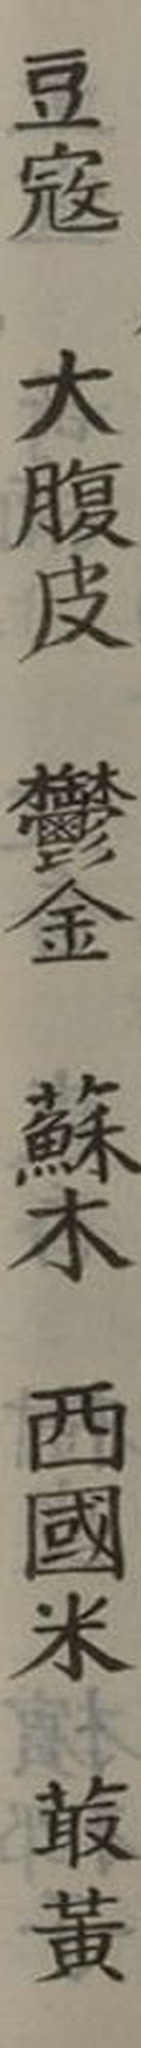豆寇大腹皮鬱金蘇木西國米黃
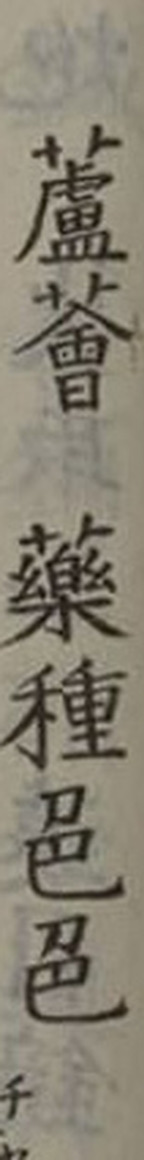蘆薈藥種色色
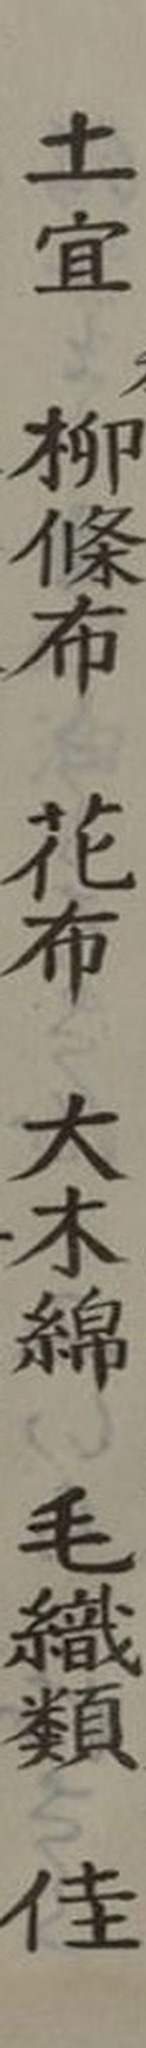土宜柳條布花布大木綿毛織類佳
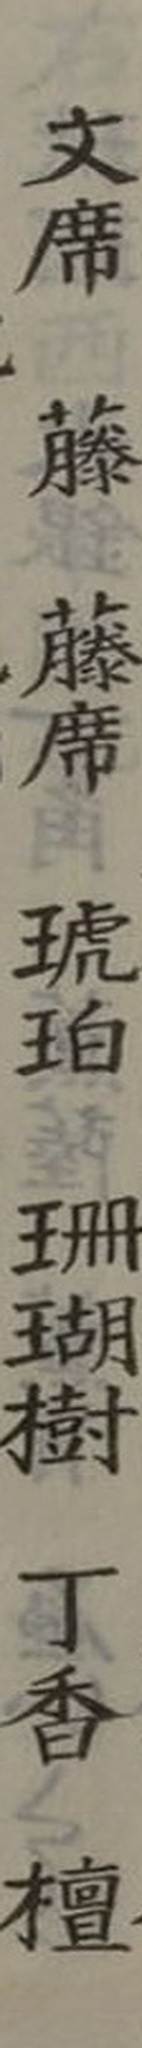文席藤藤席琥珀珊瑚樹丁香檀
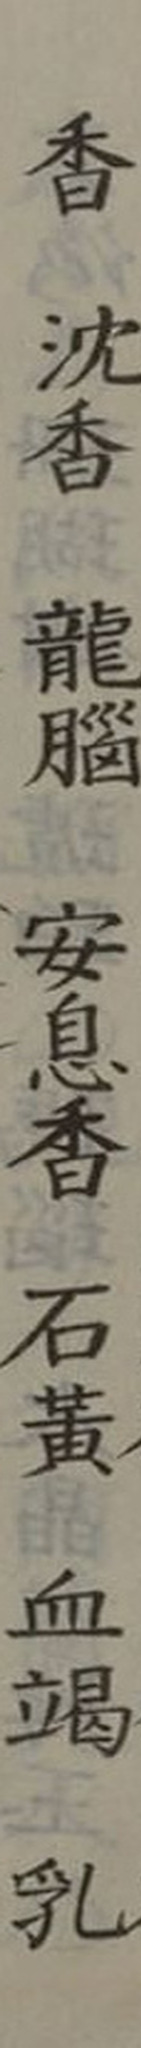香沈香龍腦安息香石黃血竭乳
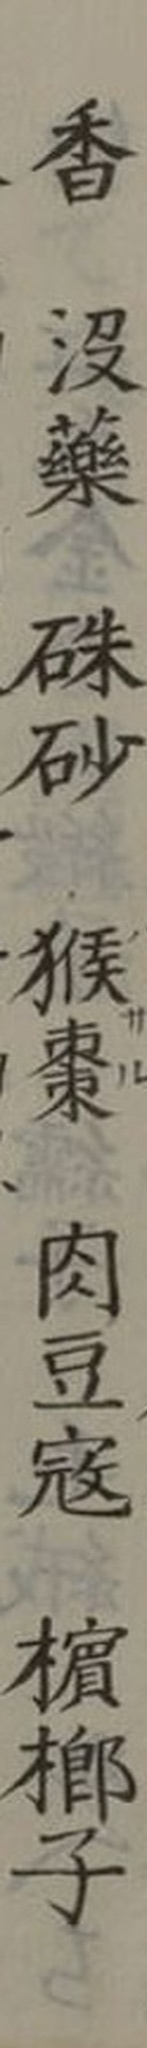香沒藥殊砂猴棗肉豆寇㯽榔子
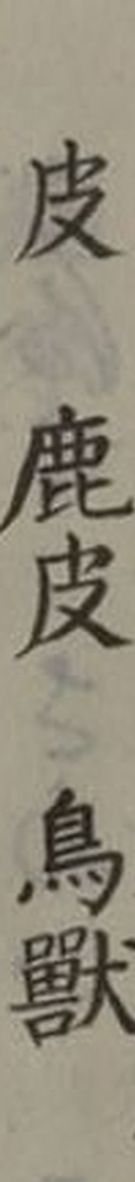皮鹿皮鳥獸

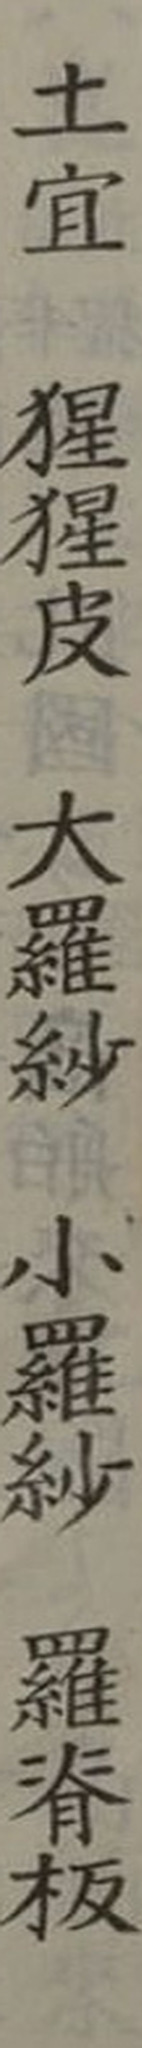土宜猩猩皮大羅紗小羅紗羅脊板
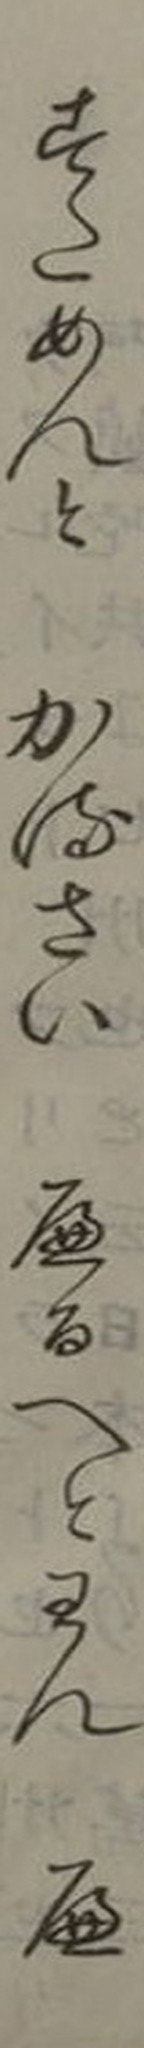すためんとかるさいへるへとわんへ
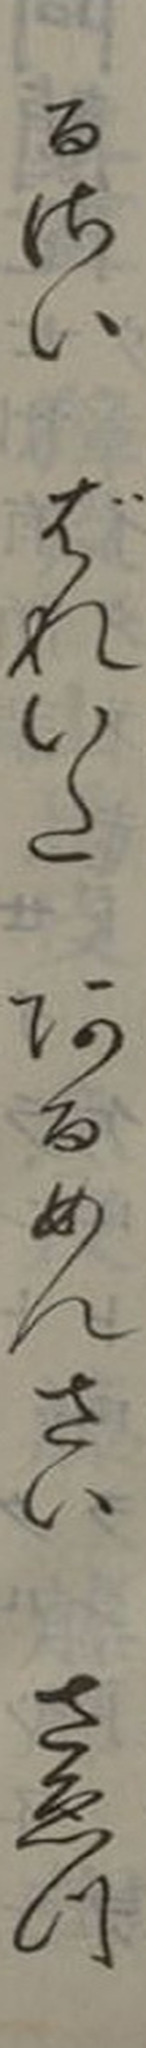るさいばれいたあるめんさいさゑつ
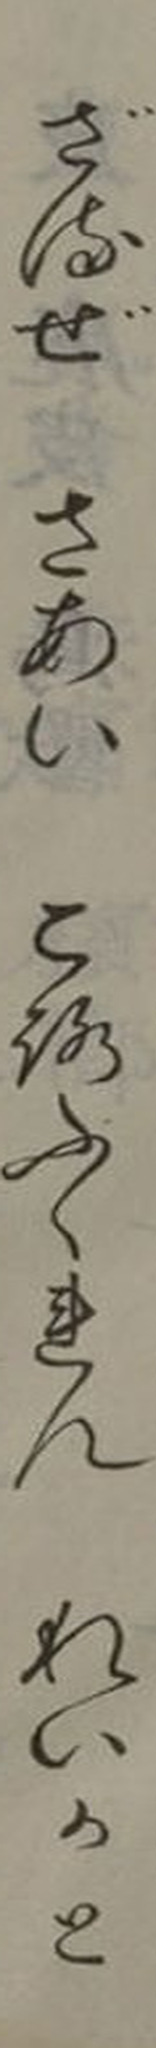ざるぜさあいころふくれんれいかと
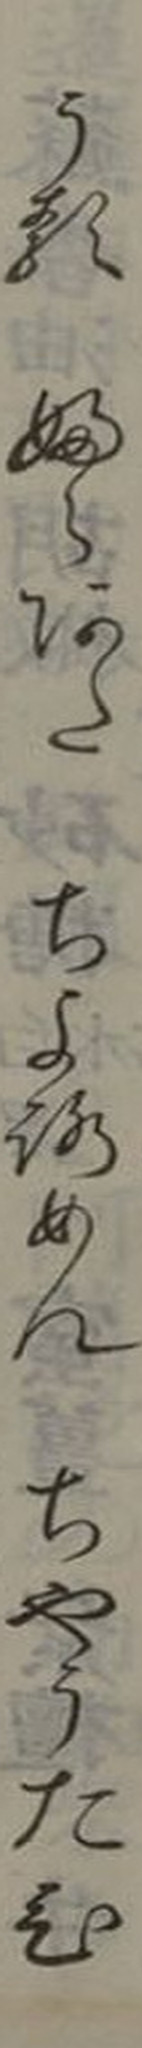うるふらあたちよりめんちやうたむ
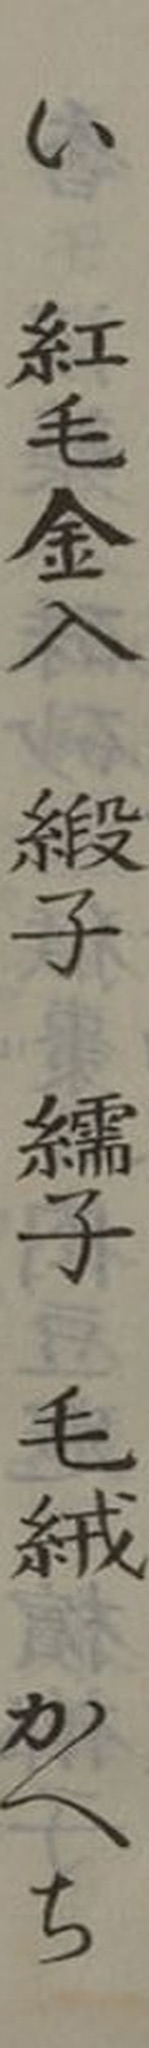い紅毛金入緞子繻子毛絨かへち
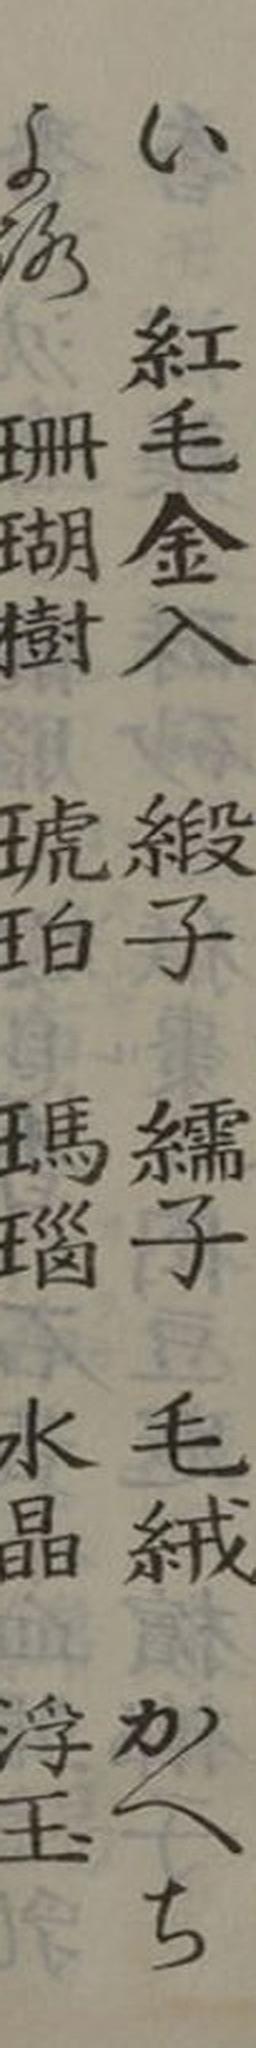よろ珊瑚樹琥珀瑪瑙水晶浮玉
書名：骨董録
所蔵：University of the Ryukyus Library
